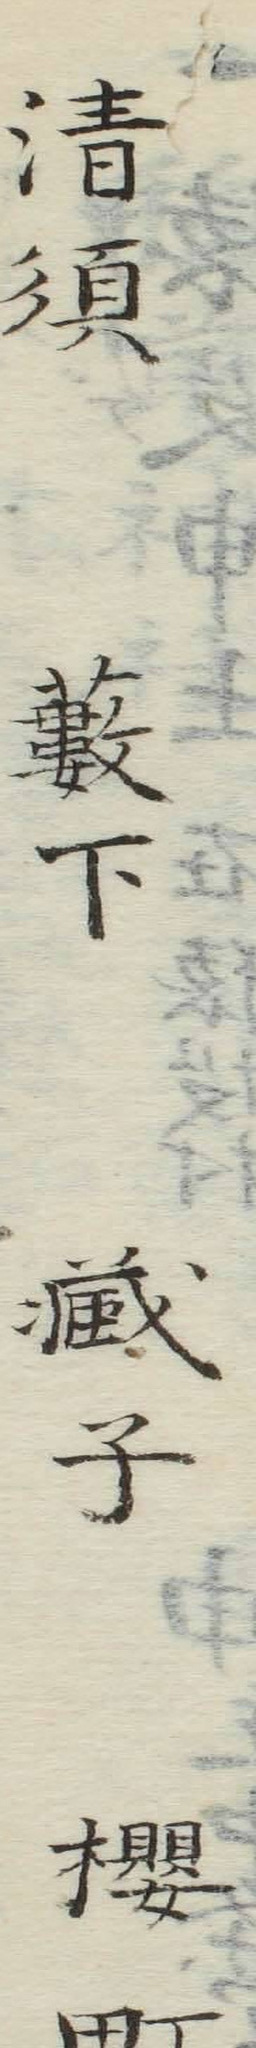清須薮下藏子桜町
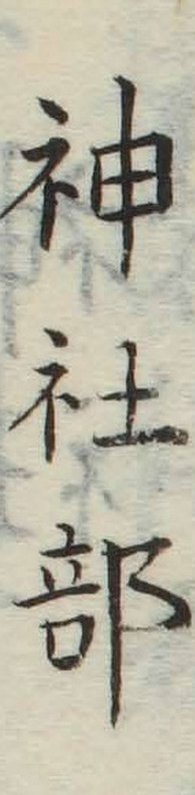神社部
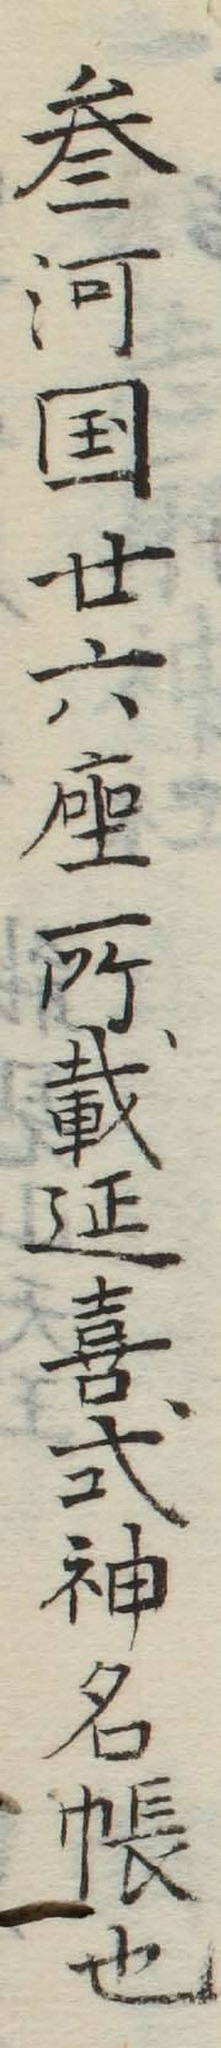参河国廿六座所載延喜式神名帳也

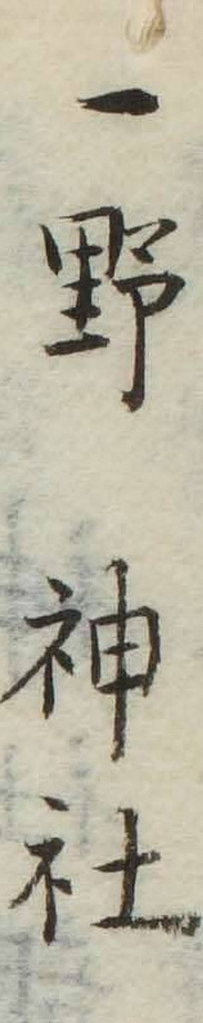一野神社
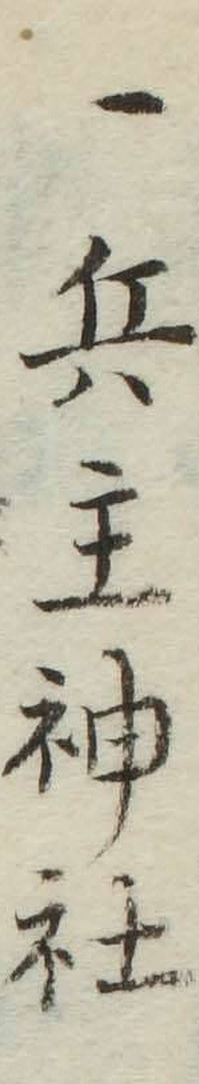一兵主神社
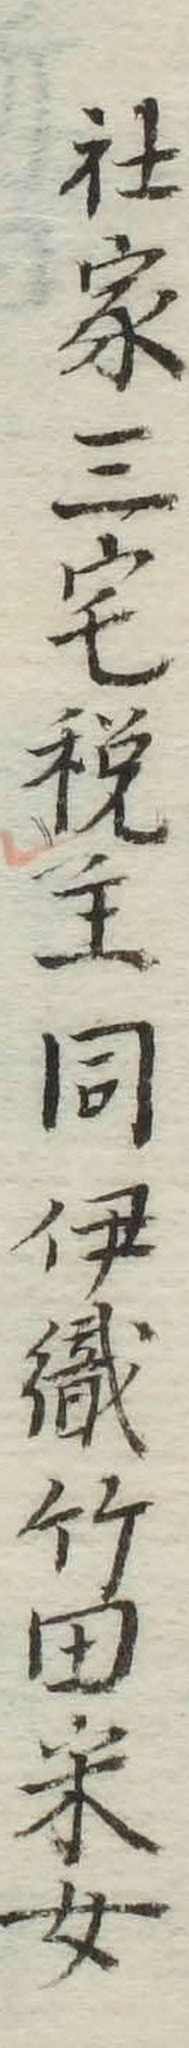社家三宅税主同伊織竹田采女
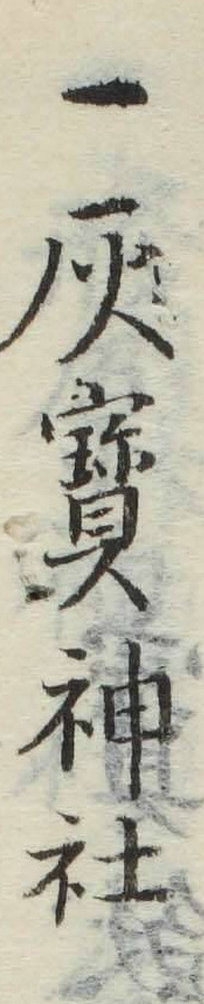一灰宝神社
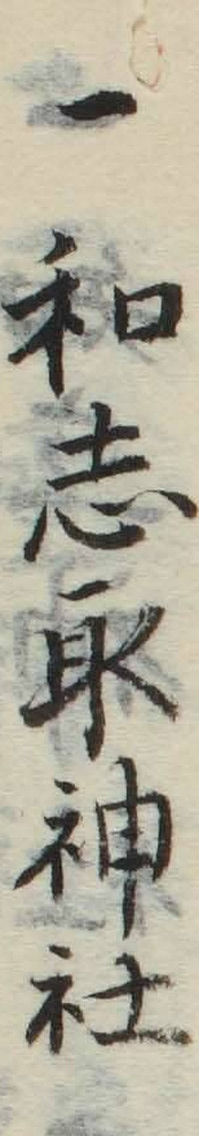一和志取神社
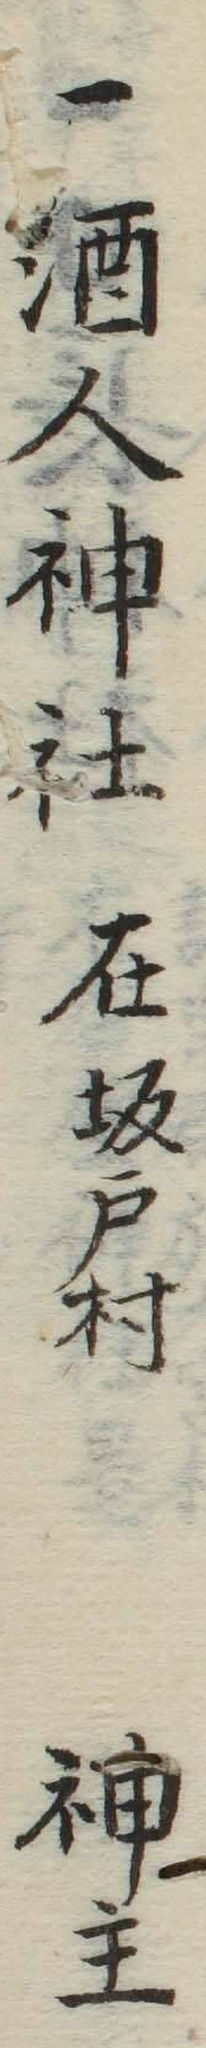一酒人神社在坂戸村

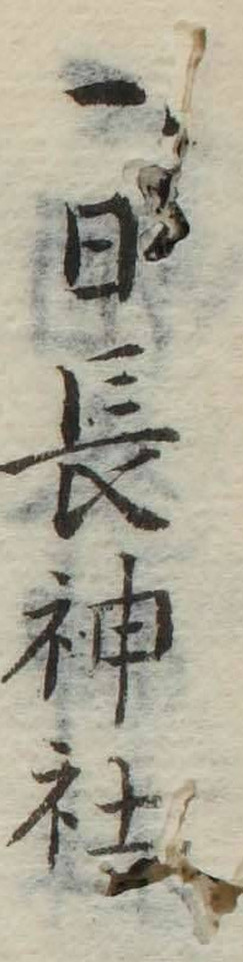一日長神社
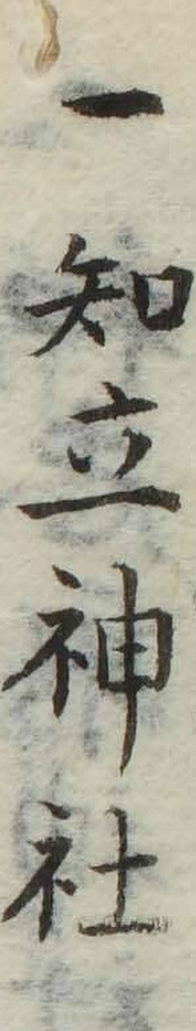一日長神社
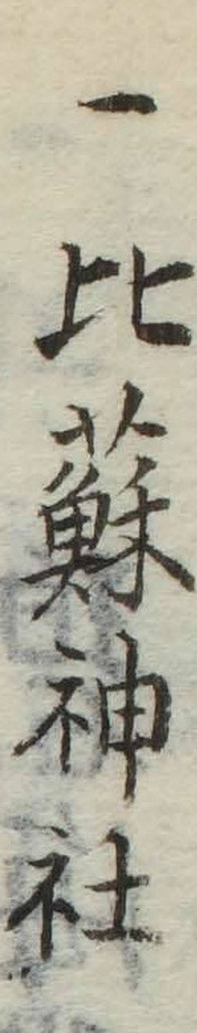一比蘇神社
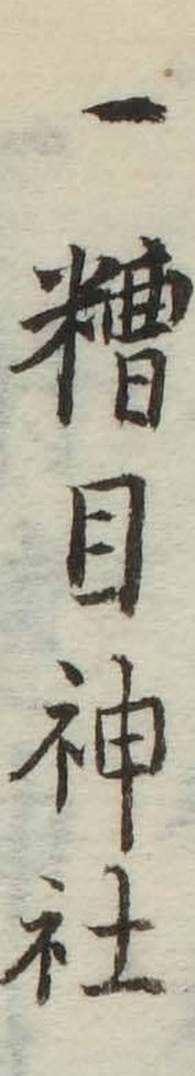一糟目神社
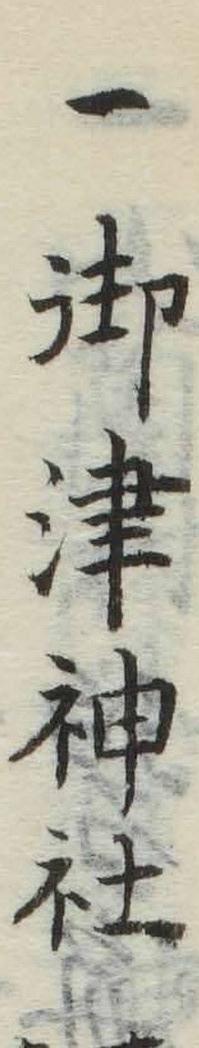一日長神社
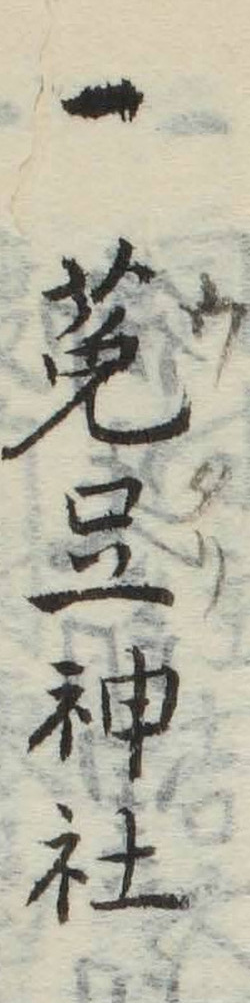一日長神社
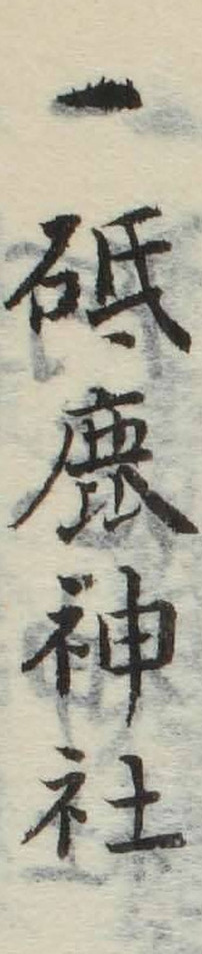一日長神社
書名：三河国二葉松
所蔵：国文学研究資料館
